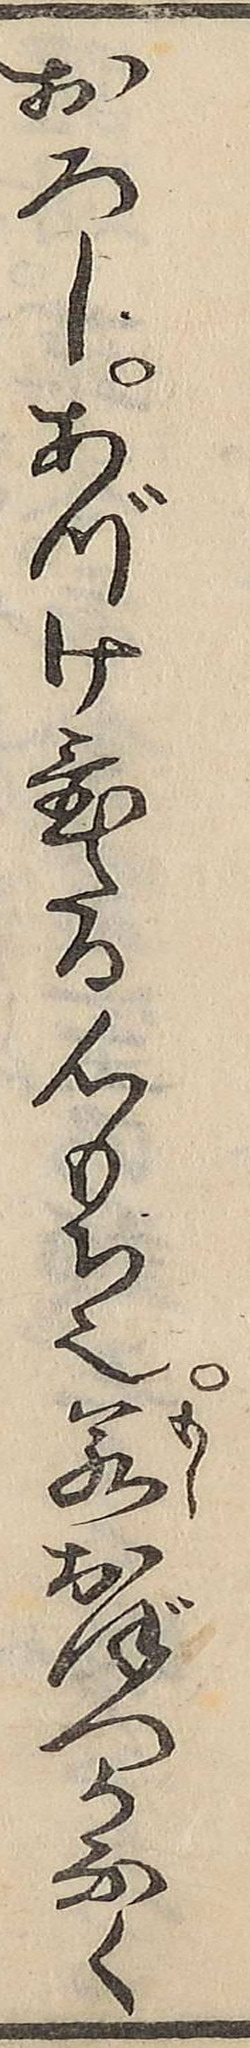おろし。あづけ置たる心もち也。若おぼつかなく
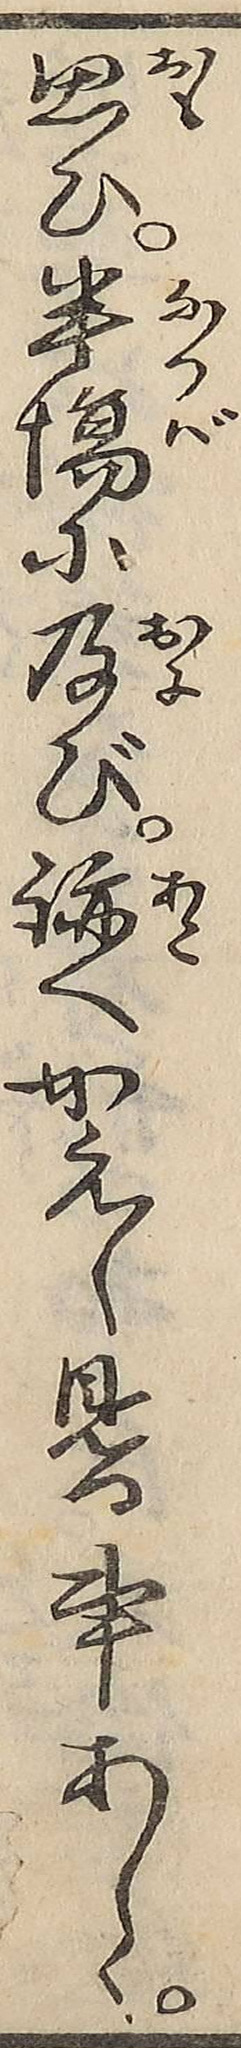思ひ。半場に及び。跡へかえし見る事あしく。
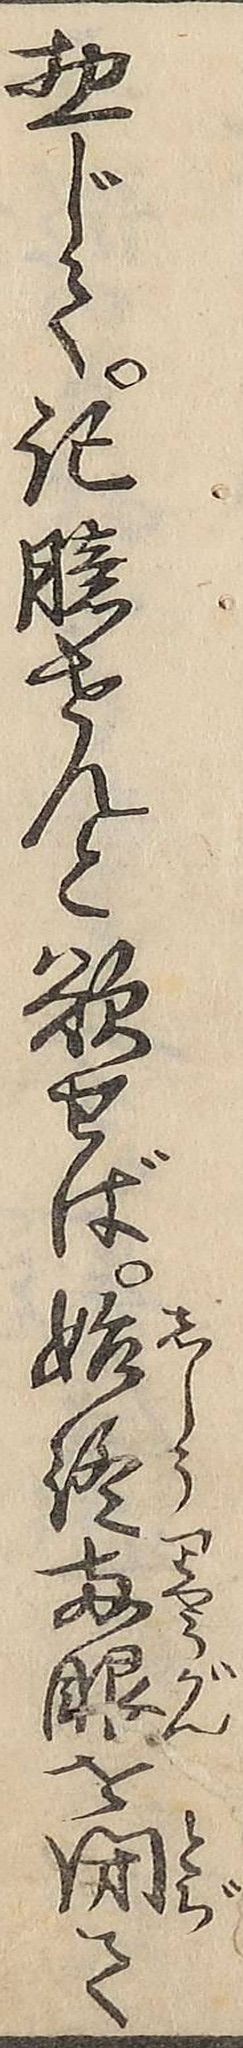惣じて。記臆せんと欲せば。始終両眼を閉て
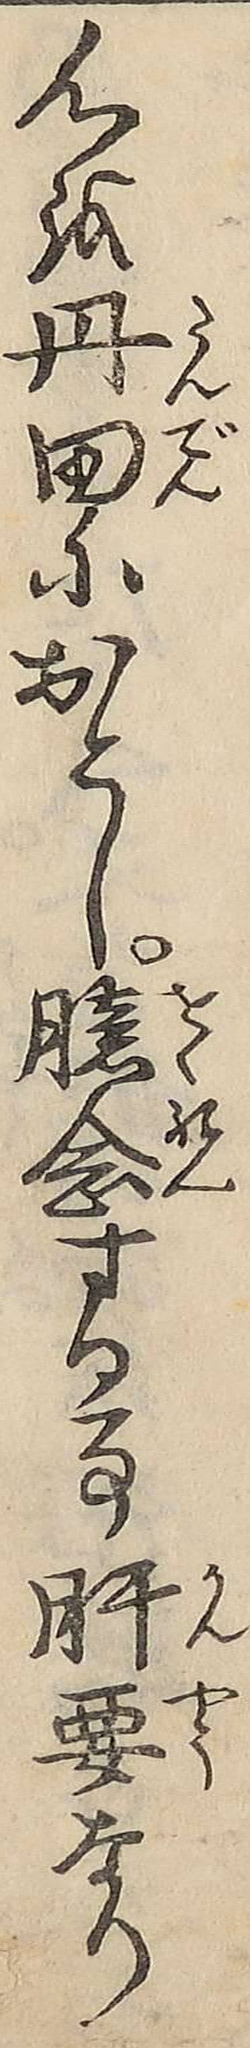心を丹田におとし。臆念する事肝要なり

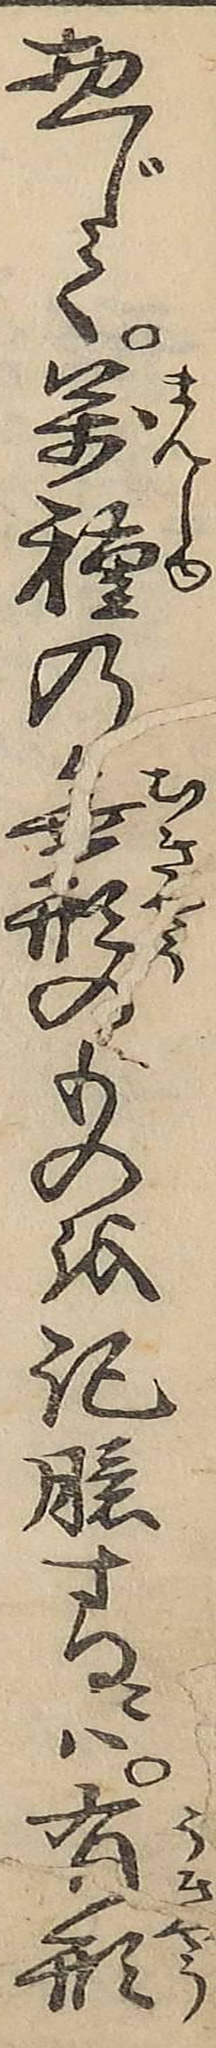惣じて。万種の無形のものを記臆するには。有形
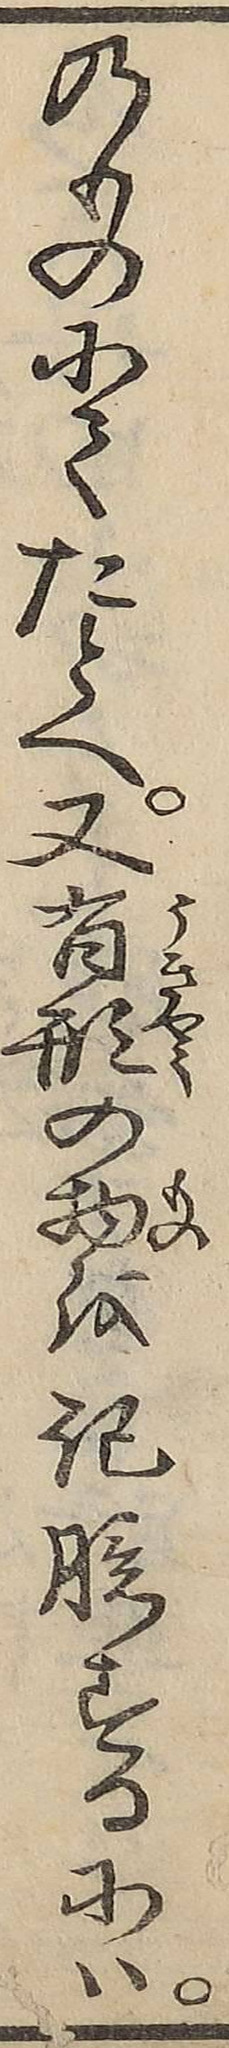のものにてたとへ。又有形の物を記臆するには。
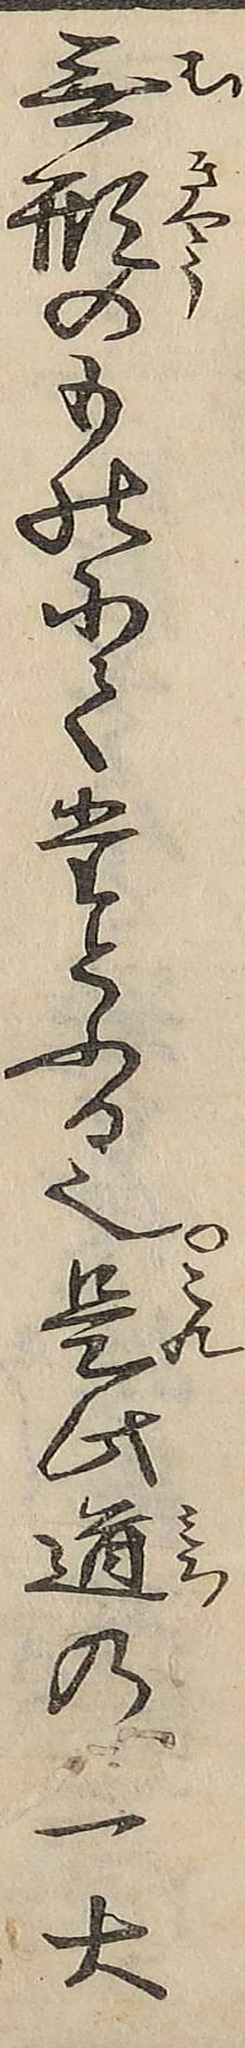無形のものにてたとふる也。是此道の一大
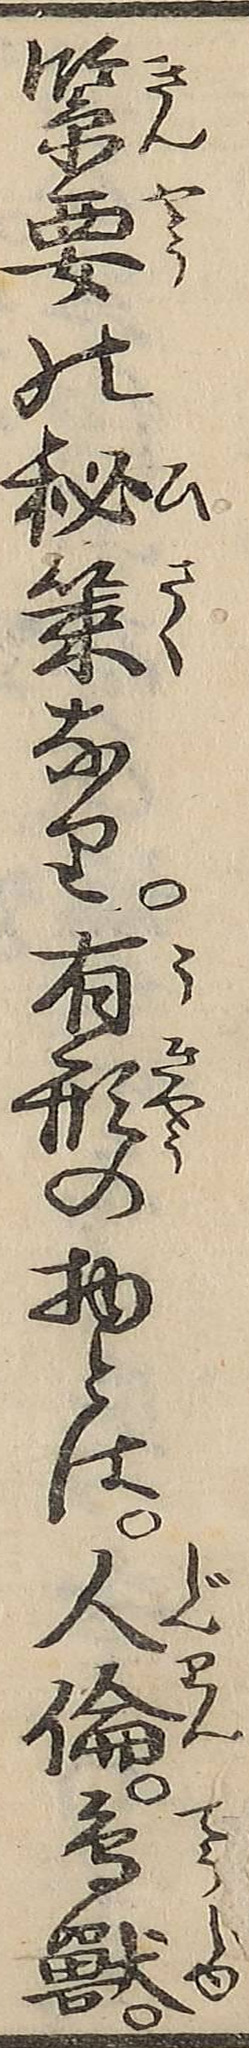緊要の秘策なり。有形の物とは。人倫。鳥獣。
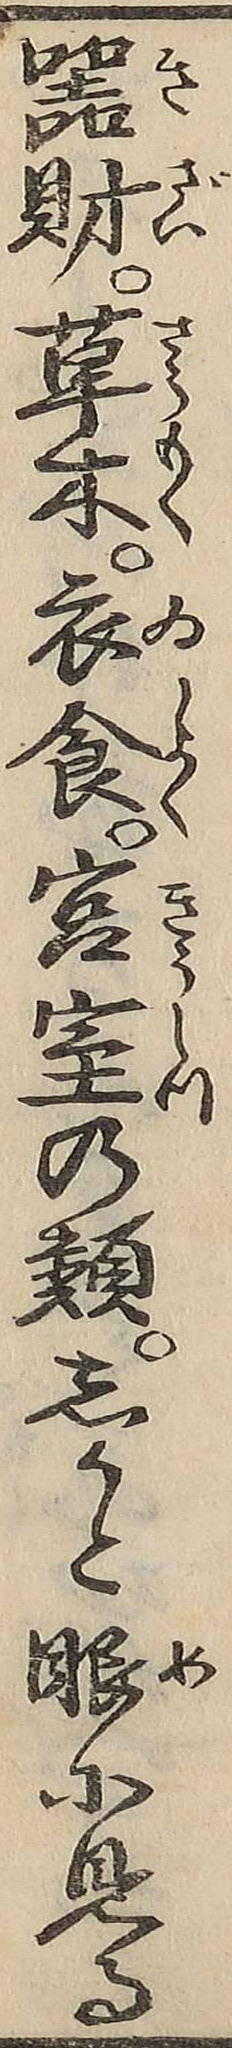器財。草木。衣食。宮室の類。しかと眼に見る
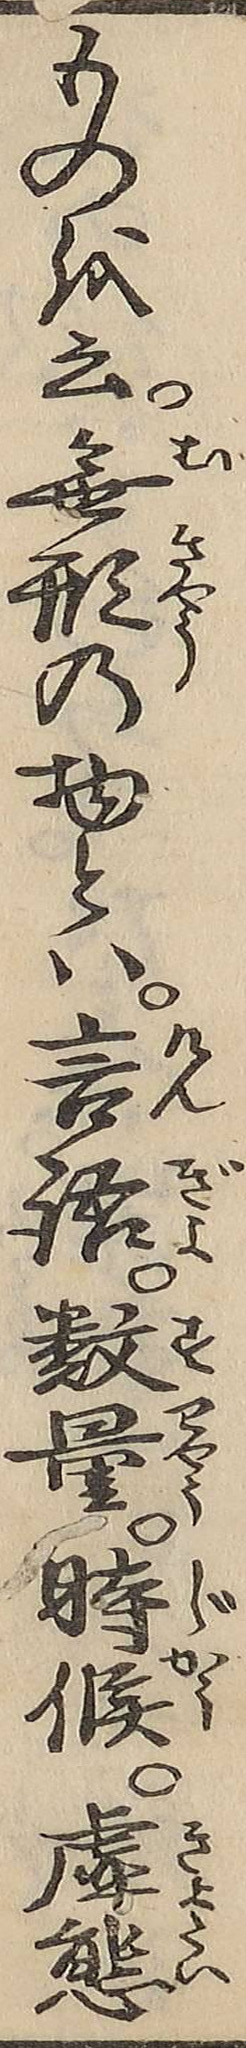ものを言。無形の物とは。言語。数量。時候。虚態
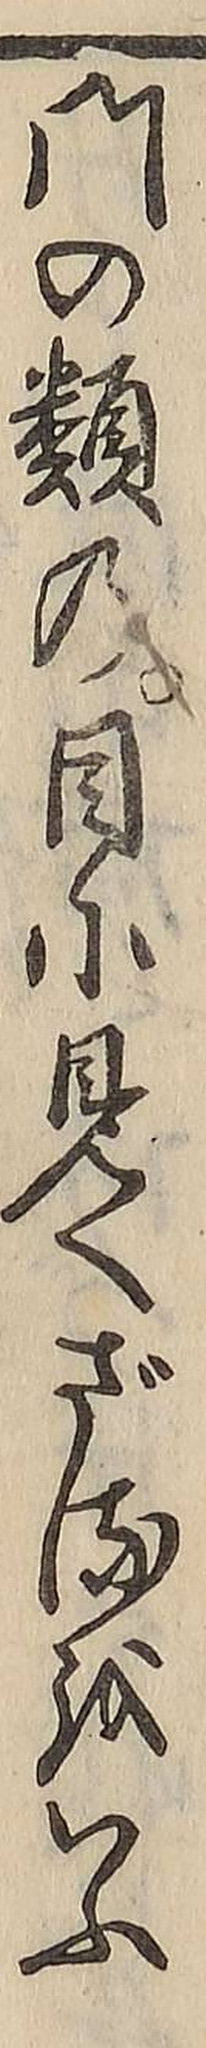門の類の。目に見へざるをいふ
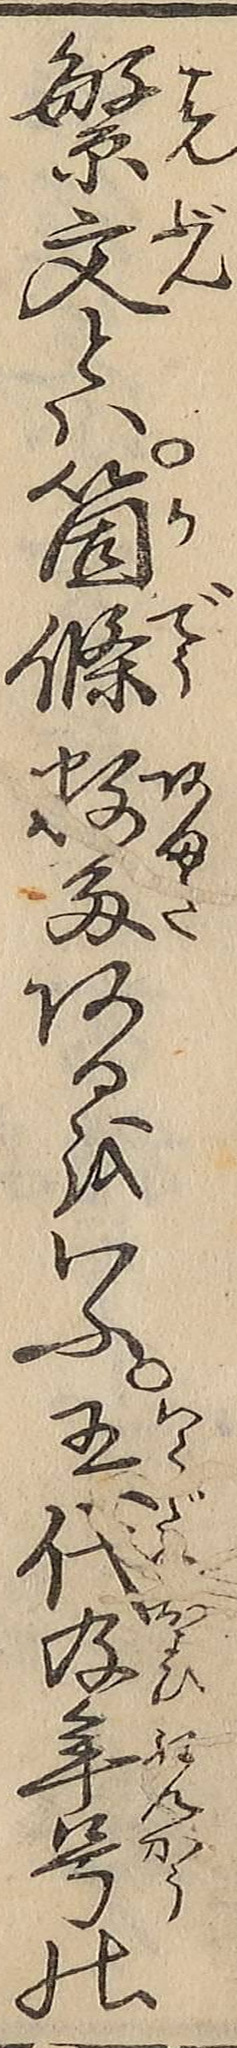繁文とは。箇條数多あるをいふ。王代及年号の
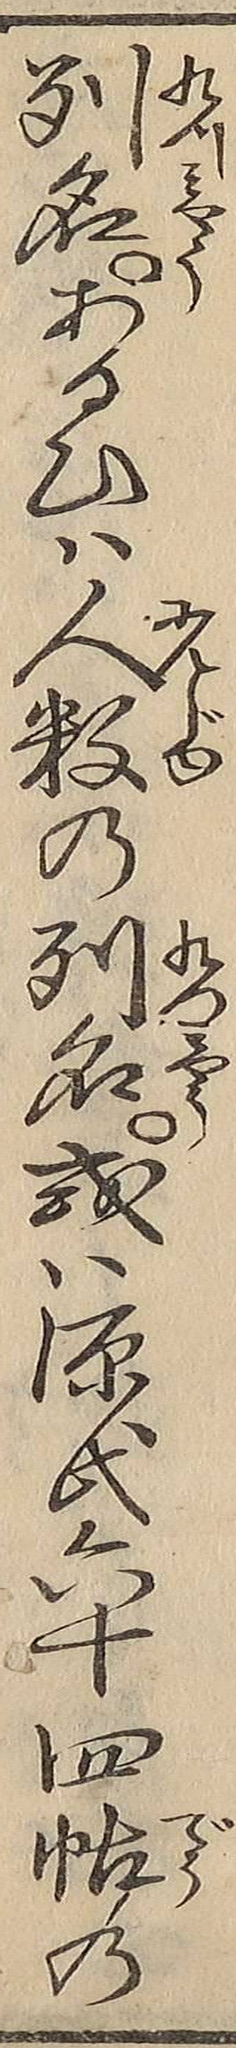列名。あるひは人数の列名。或は源氏六十四帖の
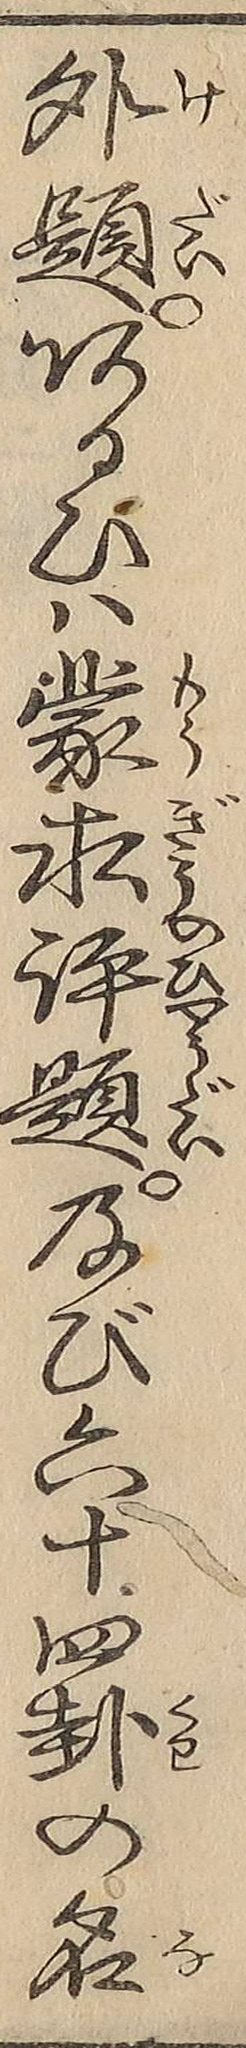外題。あるひは蒙求評題。及び六十四卦の名
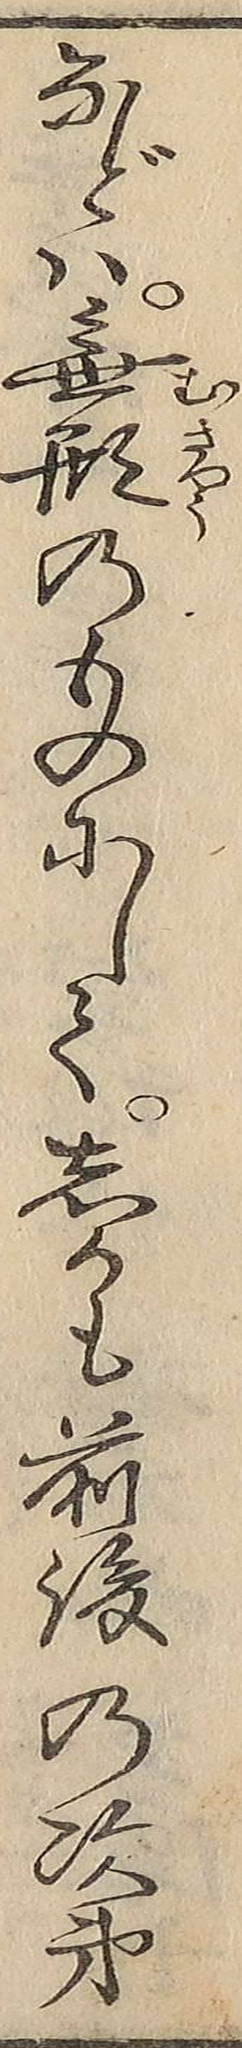などは。無形のものにして。しかも前後の次第
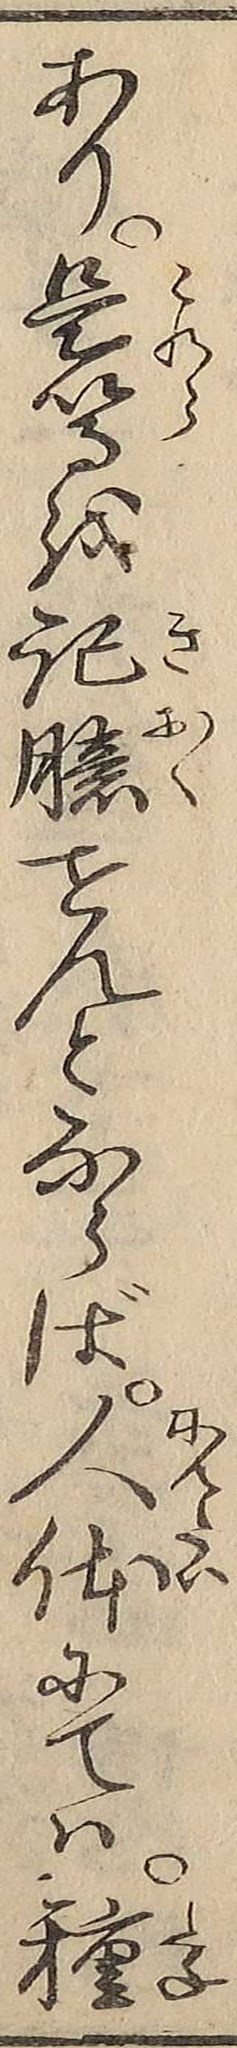あり。是等を記臆せんとならば。人体にては。種
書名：物覺秘傳
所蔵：神戸大学附属図書館 国文学研究資料館
